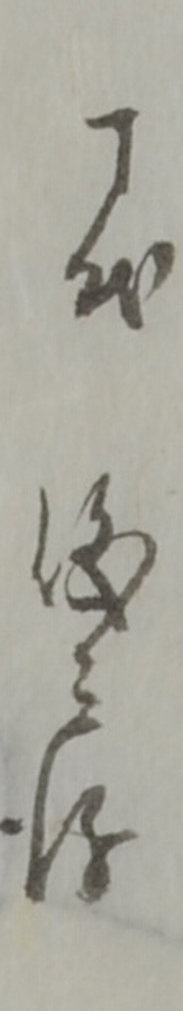丁代儀兵衛
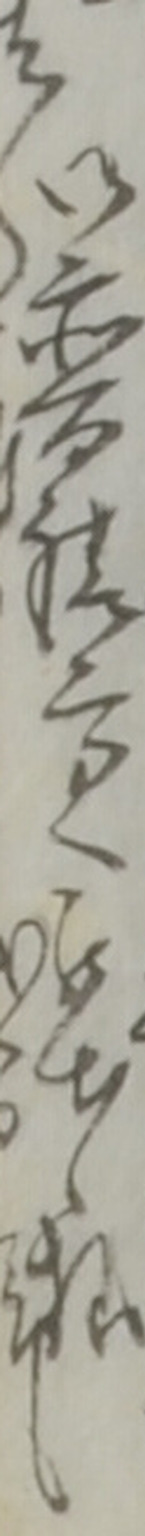御普請方へ罷出候様

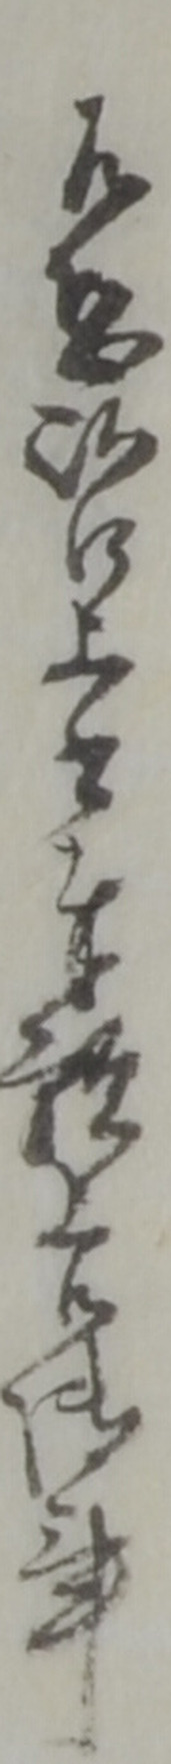乍恐以口上書奉願上候御事
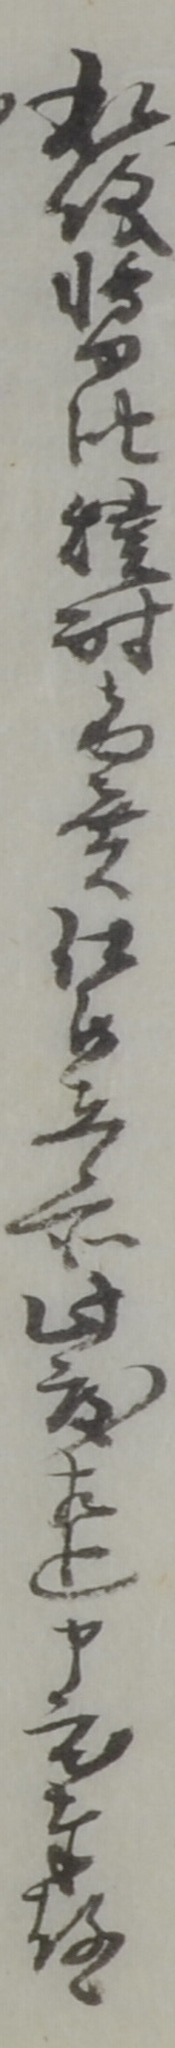私儀醤油焼酎商売仕罷在候所此度相止申度奉存候
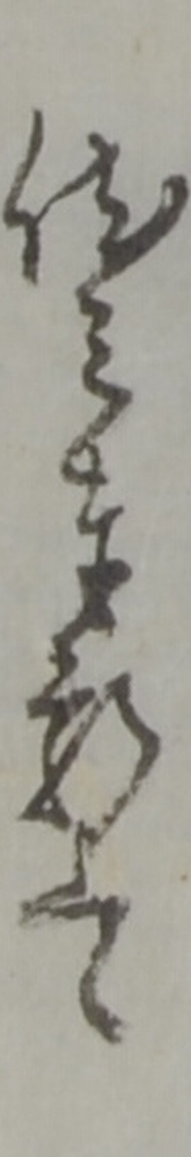依之奉願上候
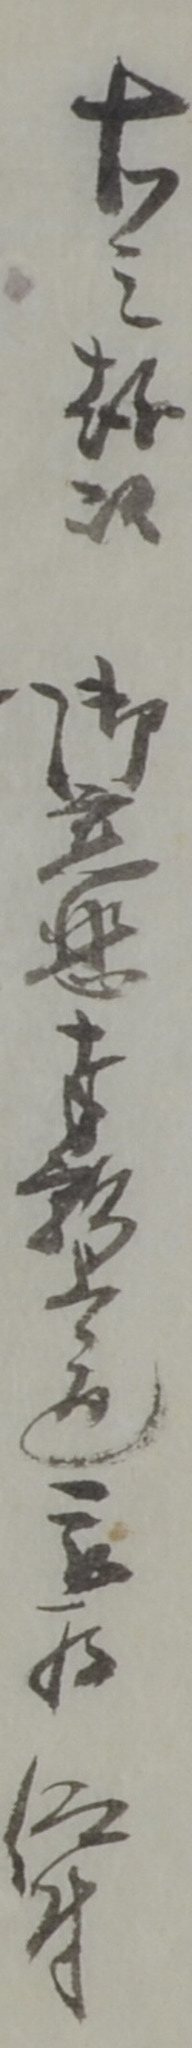右之趣以御慈悲奉願上候通被為仰付
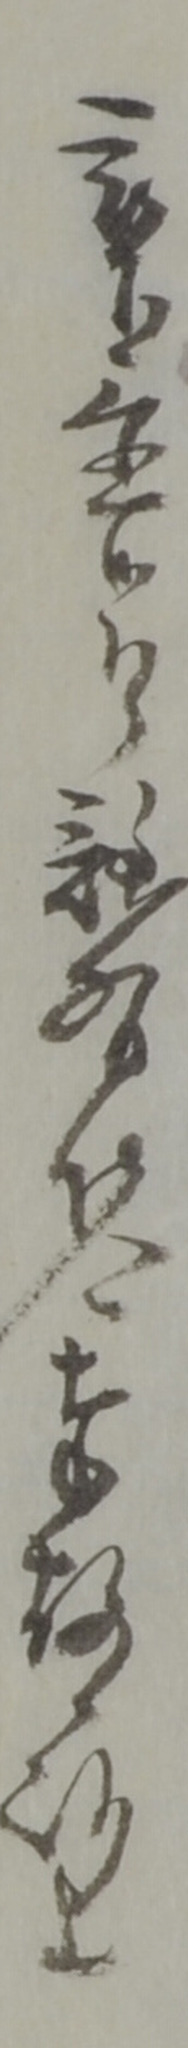被下置候ハヽ難有仕合奉存候以上
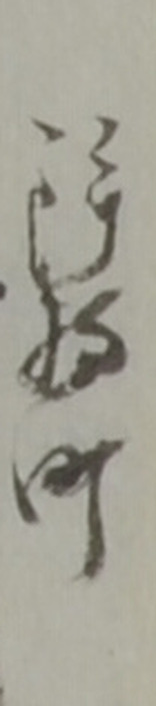鉾持町
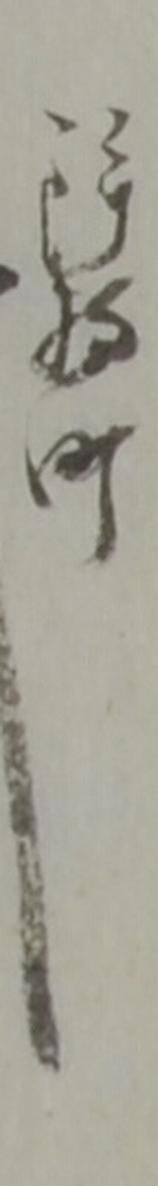鉾持町
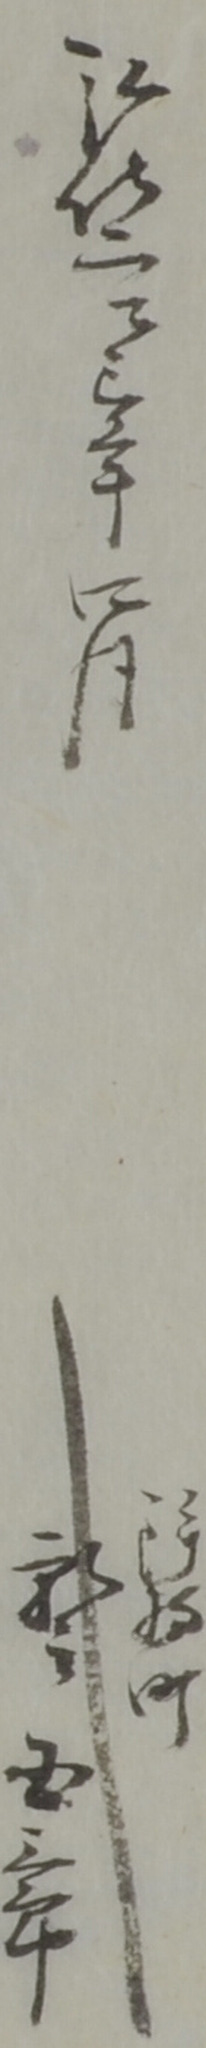弘化二乙巳年四月願主国三郎
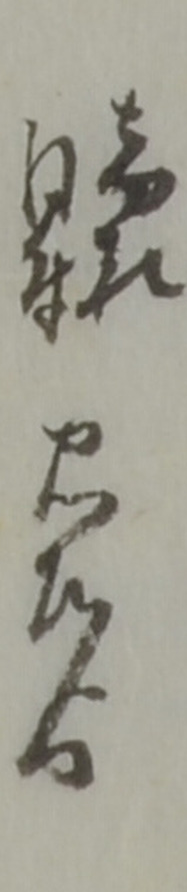目付忠左衛門
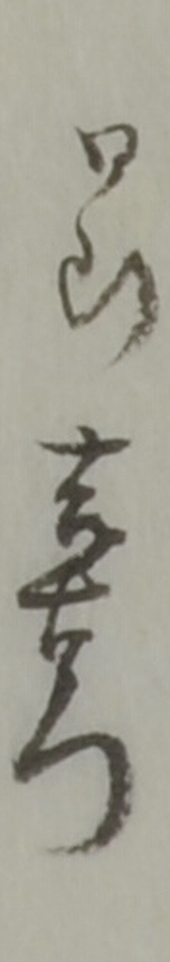同断吉右衛門
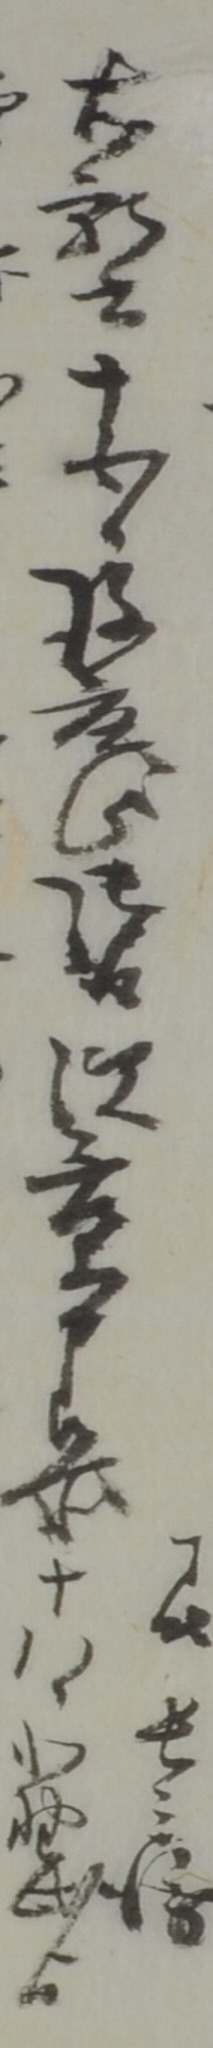右願書十五日後藤氏御取次差上申候所十八日北野氏ゟ
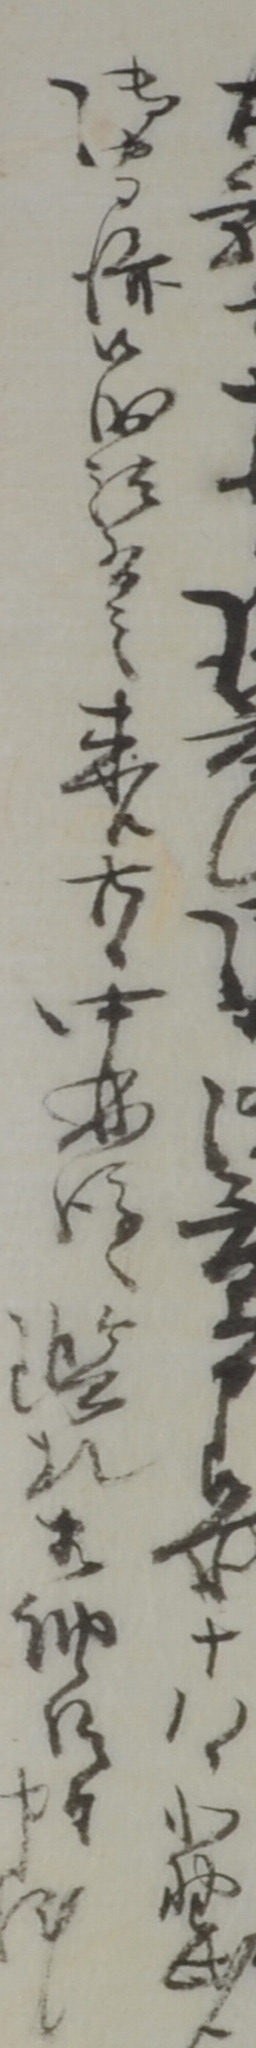御聞済御沙汰有之来ル廿日中西様へ鑑札相納仰付申渡候
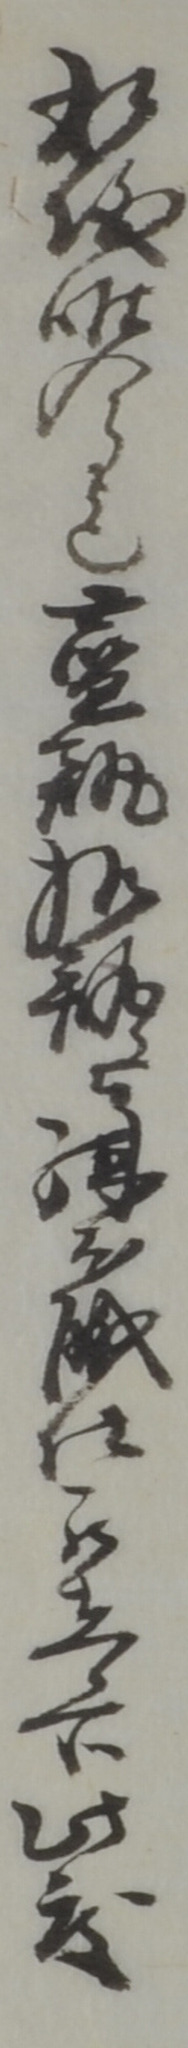私儀唯今迄藍瓶拾瓶ニ而紺屋仕罷在候所此度
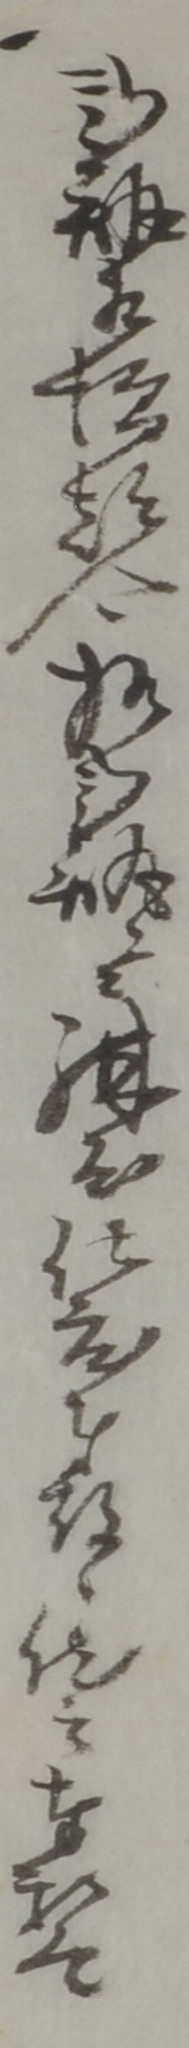弐瓶相増都合拾弐瓶ニ而紺屋仕度奉存候依之奉願上候
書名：諸願書控簿
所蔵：伊那市立高遠町図書館・合同会社AMANE
